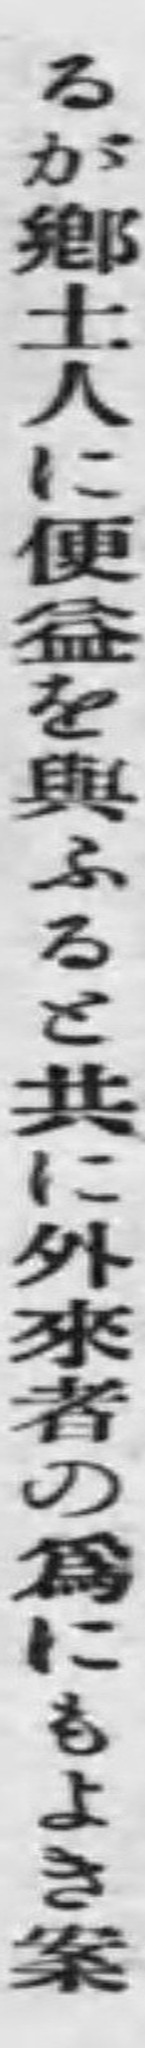るが鄕土人に便益を與ふると共に外來者の為にもよき案
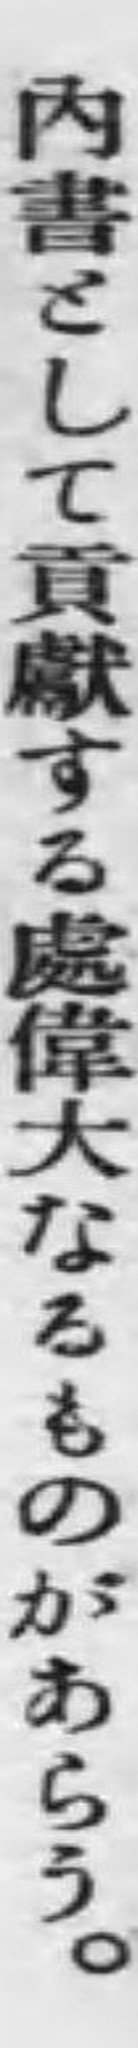内書として貢献する處偉大なるものがあらう。
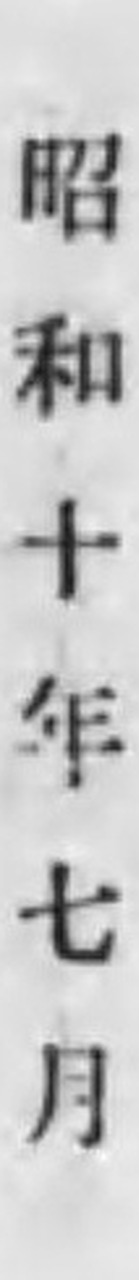昭和十年七月
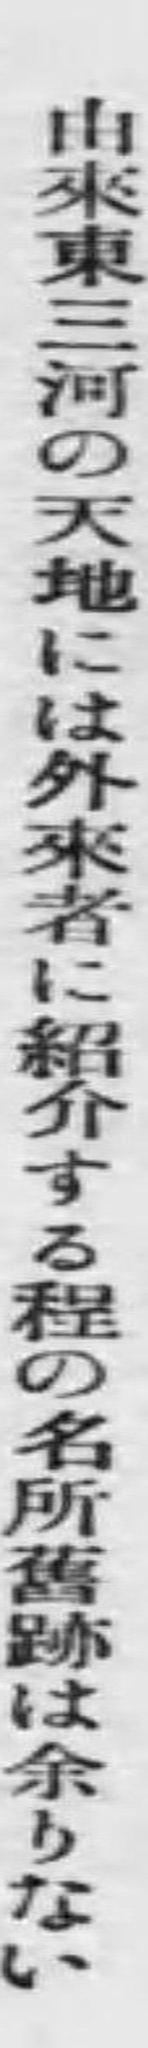由來東三河の天地には外來者に紹介する程の名所舊跡は余りない
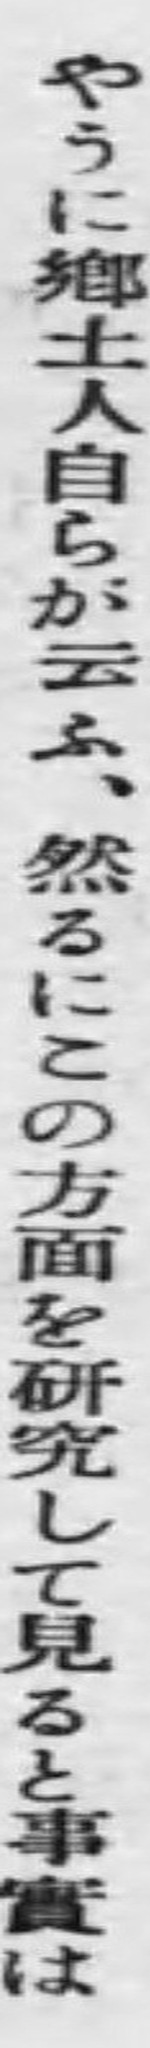やうに鄕土人自らが云ふ、然るにこの方面を研究して見ると事實は
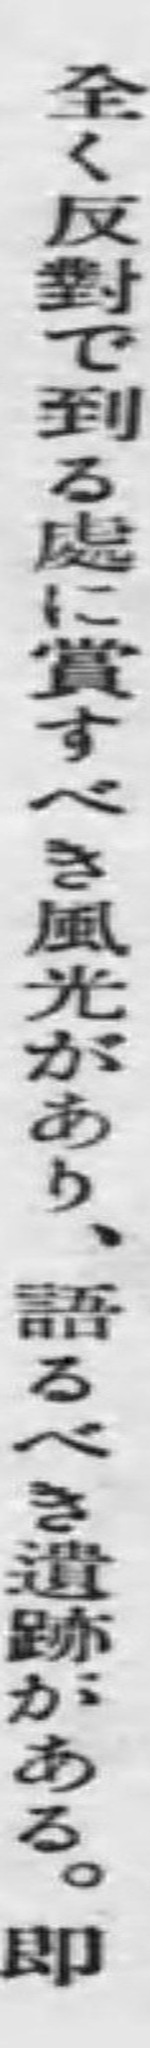全く反對で到る處に賞すべき風光があり、語るべき遺跡がある。即
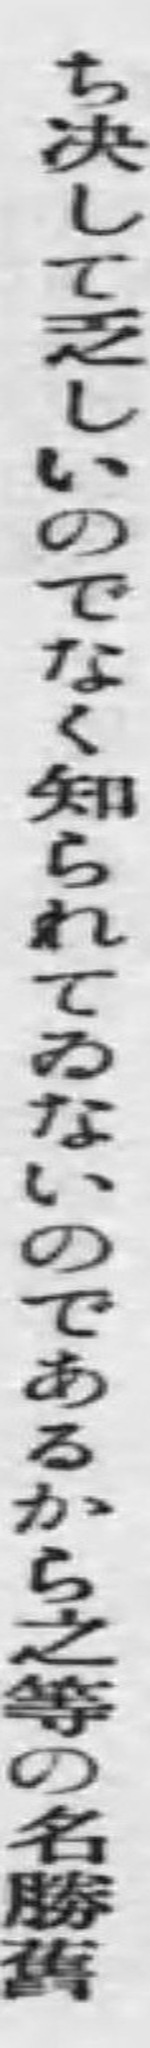ち決して乏しいのでなく知られてゐないのであるから之等の名勝舊
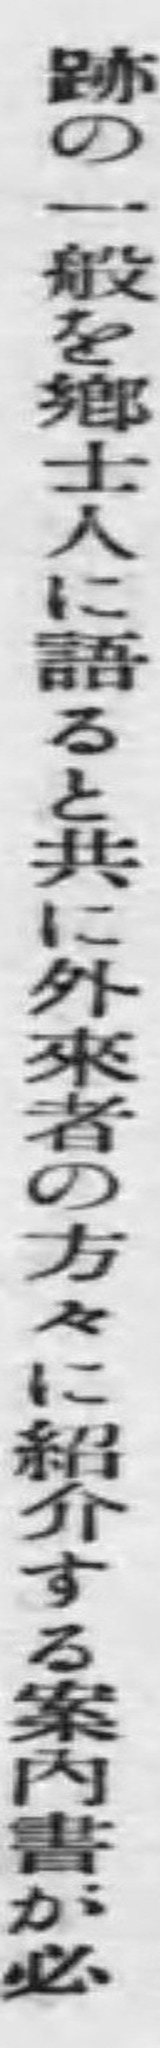跡の一般を鄕士人に語ると共に外來者の方々に紹介する案内書が必
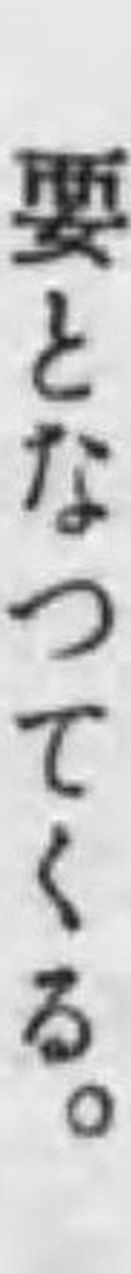要となつてくる。
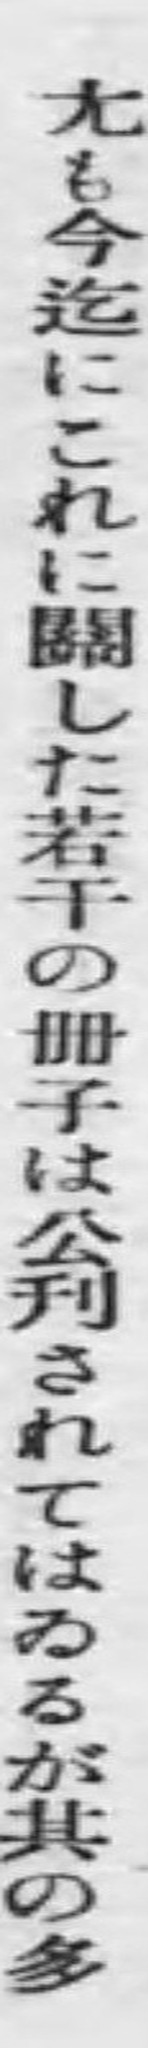尤も今迄にこれに關した若干の冊子は公刊されてはゐるが其の多
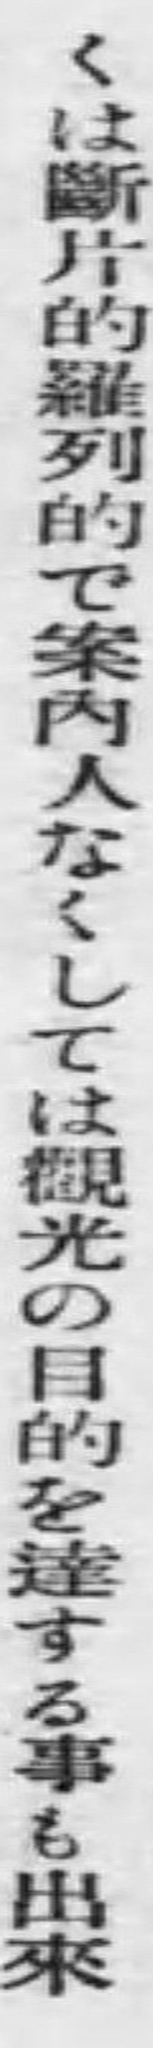くは斷片的羅列的で案内人なくしては観光の目的を達する事も出來
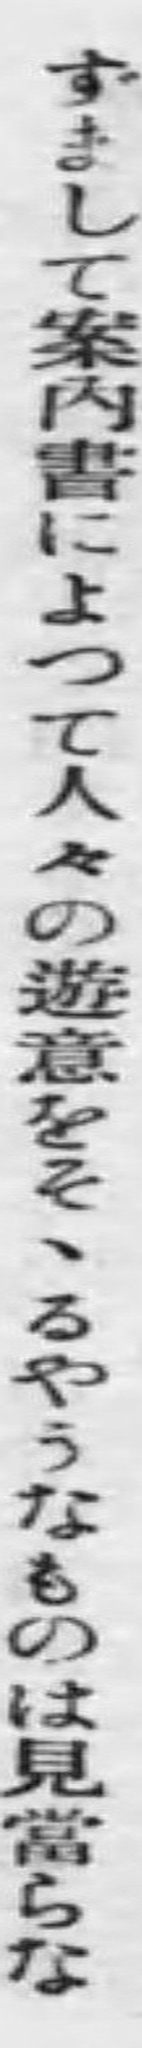ずまして案内書によつて人々の遊意をそヽるやうなものは見當らな
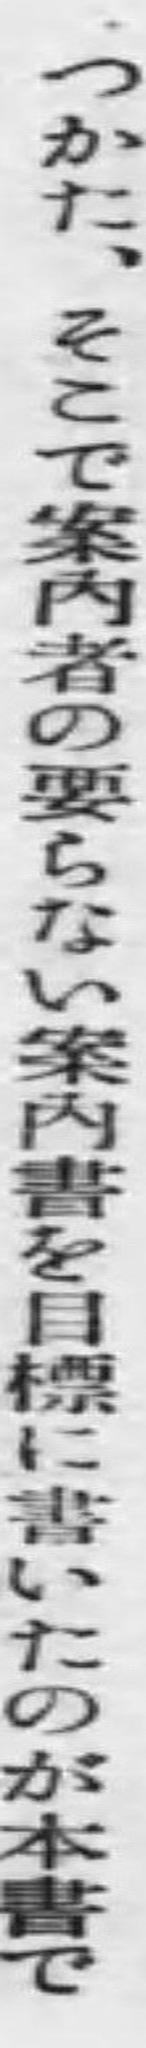つかた、そこで案内書の要らない案内書を目標に書いたのが本書で
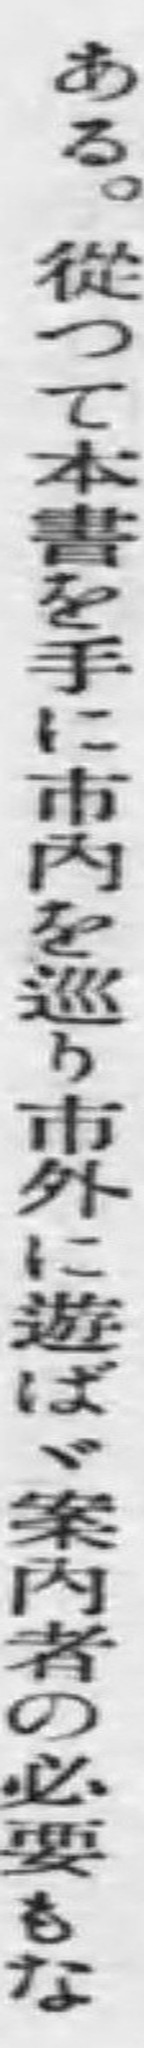ある。従つて本書を手に市内を巡り市外に遊ばヾ案内者の必要もな

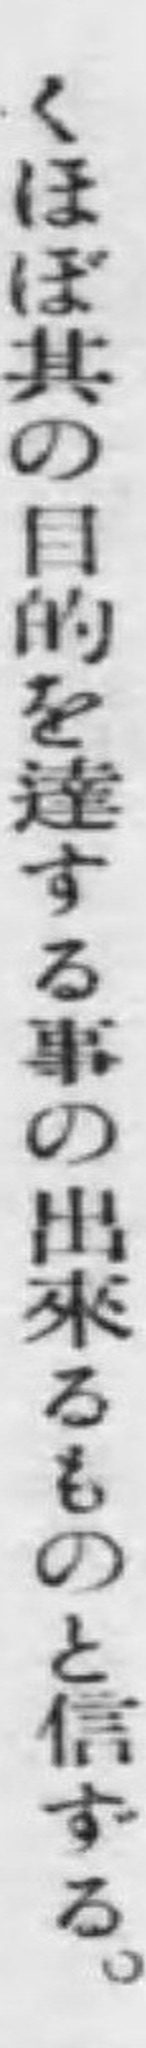くほぼ其の目的を達する事の出來るものと信ずる。
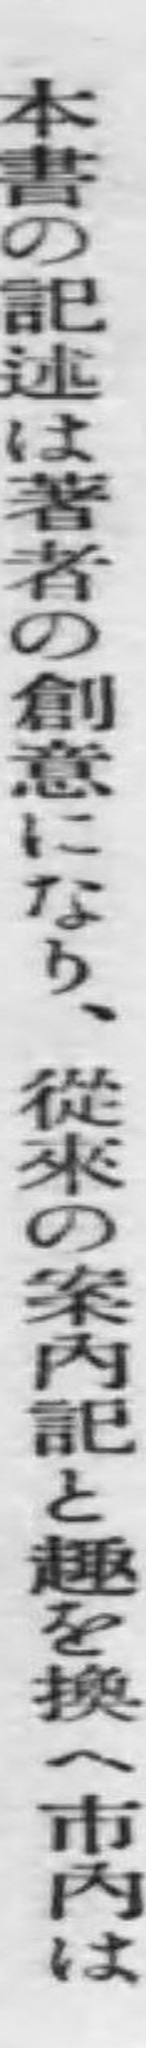本書の記述は著者の創意になり、從来の案内記と趣を換へ市内は
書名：東三河道中記 : 豊橋市及其附近案内
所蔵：国立国会図書館 National Diet Library, JAPAN
